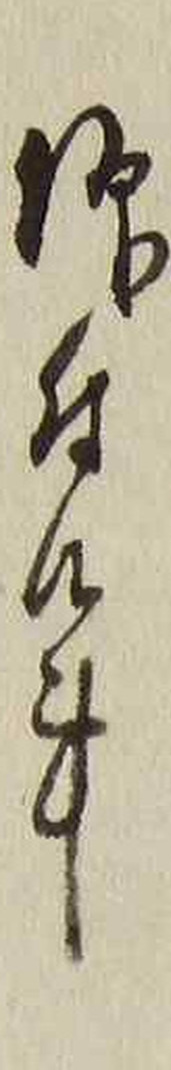仰付候事
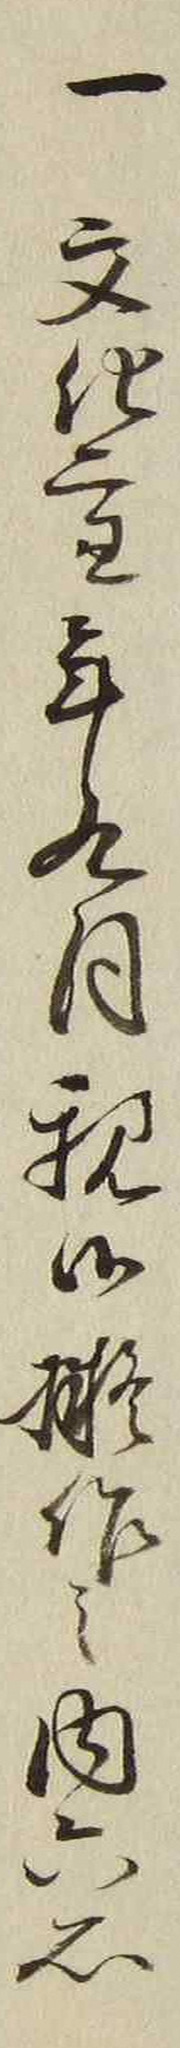一文化二丑年九月親御擬作之内六石
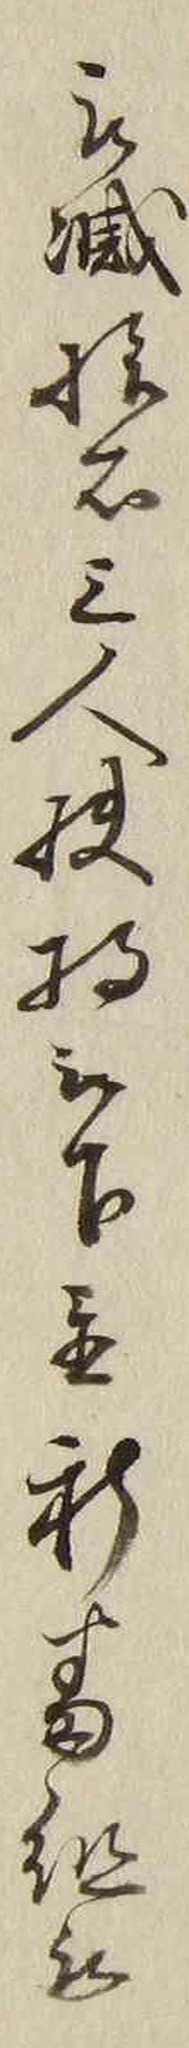被減拾石三人扶持被下置新番組被
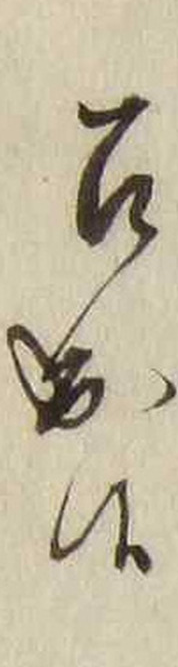召出候

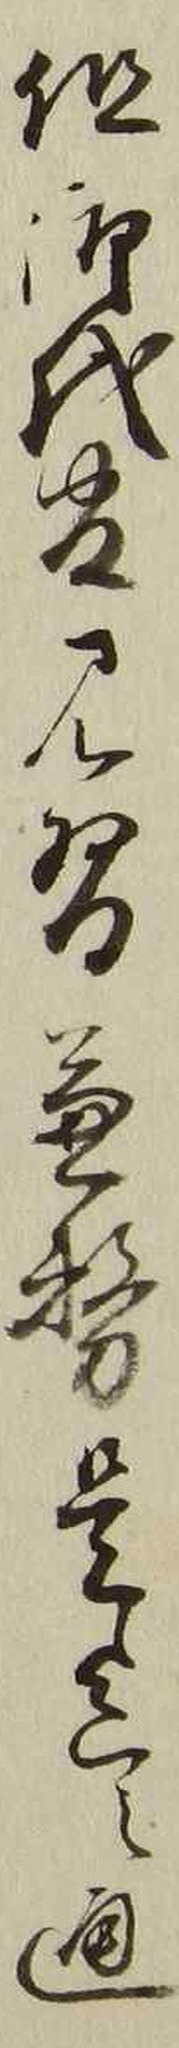但御代官見習兼務是迄之通
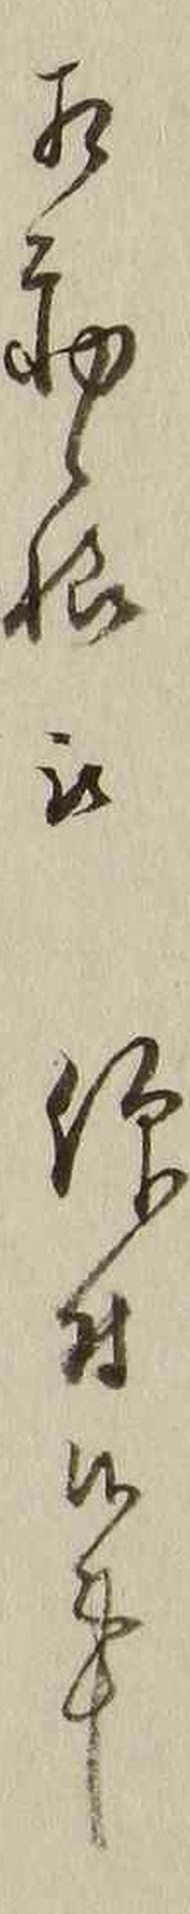相勤候様被仰付候事
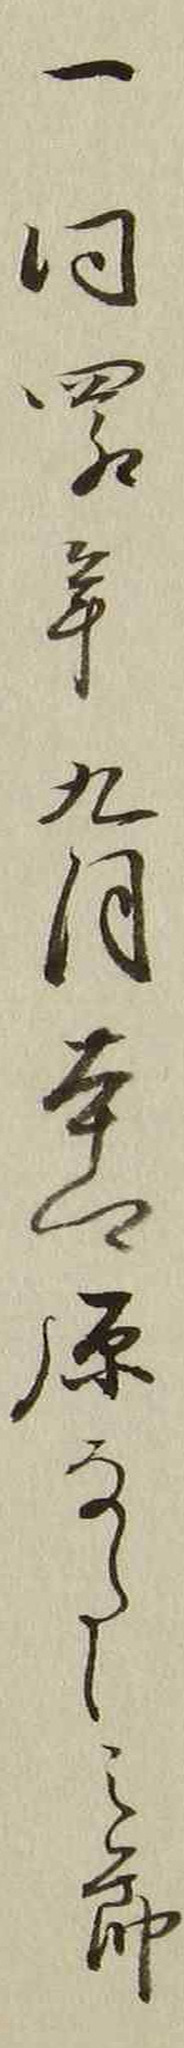一同四卯年九月本郷原ならし之節
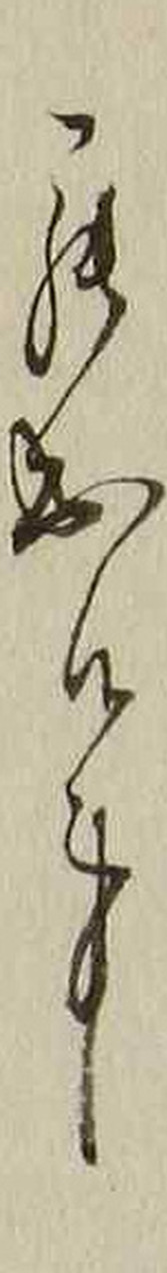罷出候事
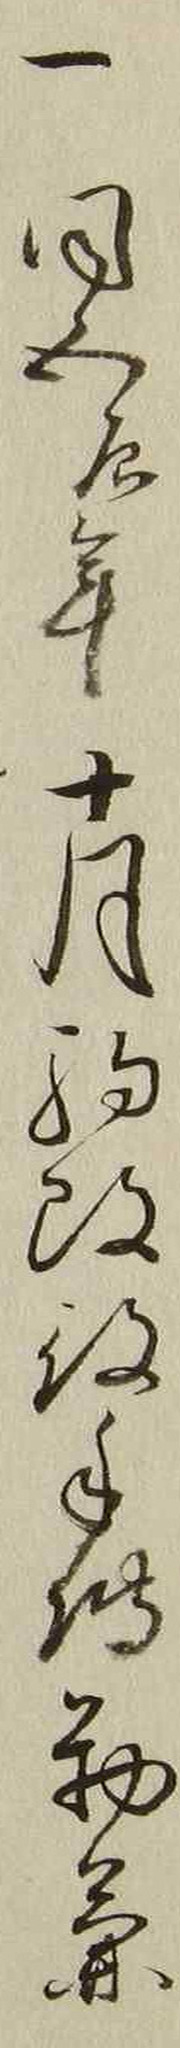一同五辰年十月駒改役手伝勤兼
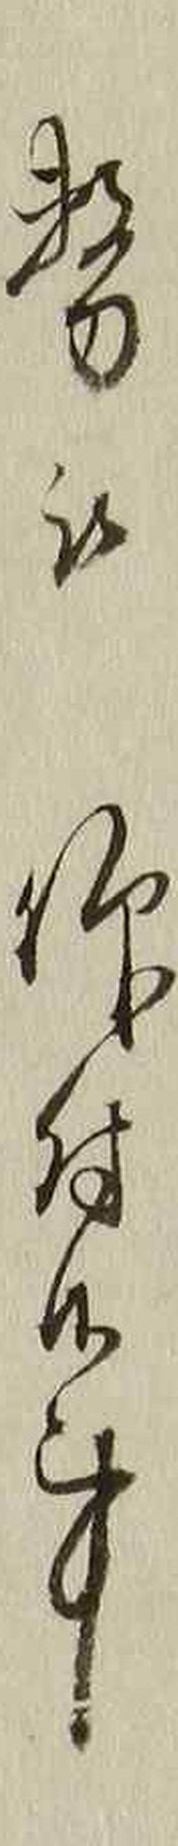務被仰付候事
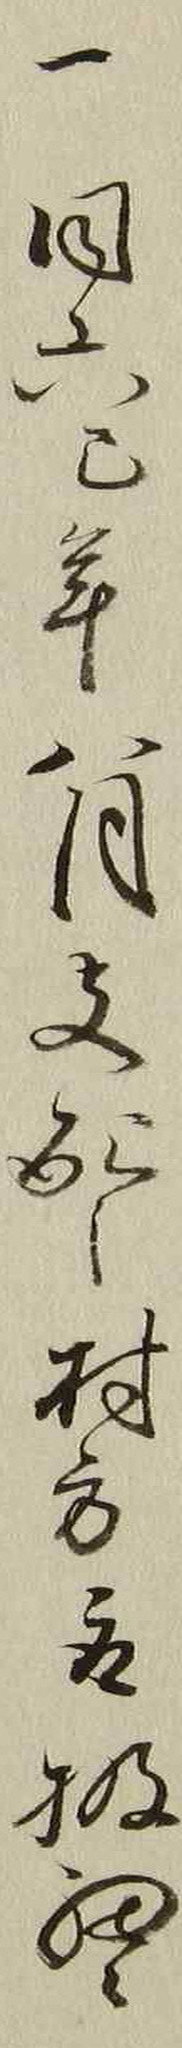一同六巳年八月支配之村方取扱細々
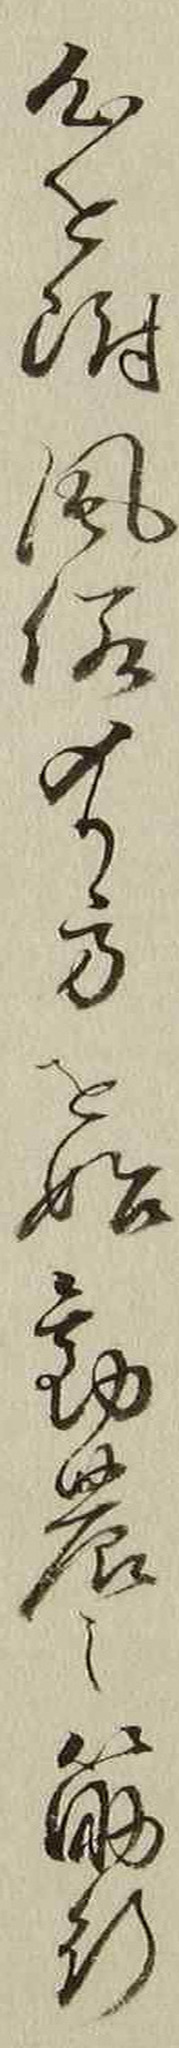心を附風俗〆り方を始勤農之筋行
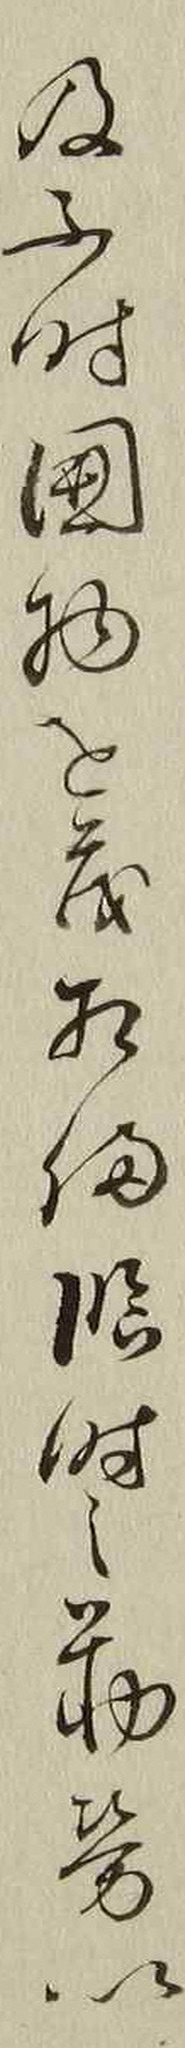及不時囲物をも相備臨時之勤労い
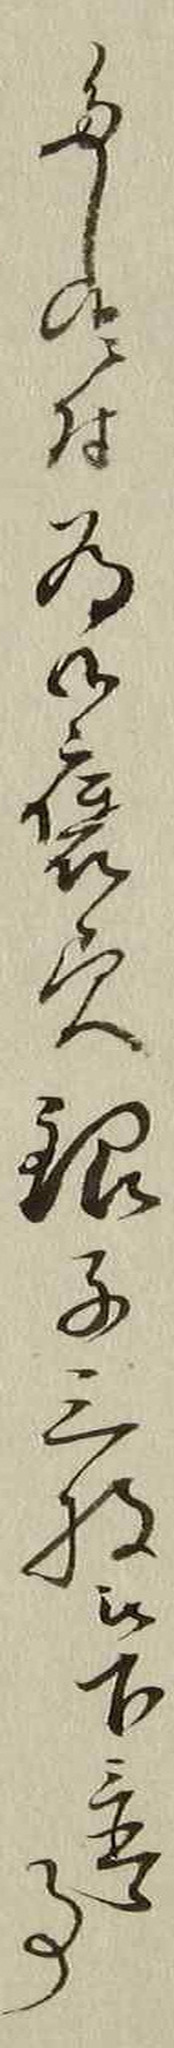たし候ニ付為御褒美銀子三枚被下置候事
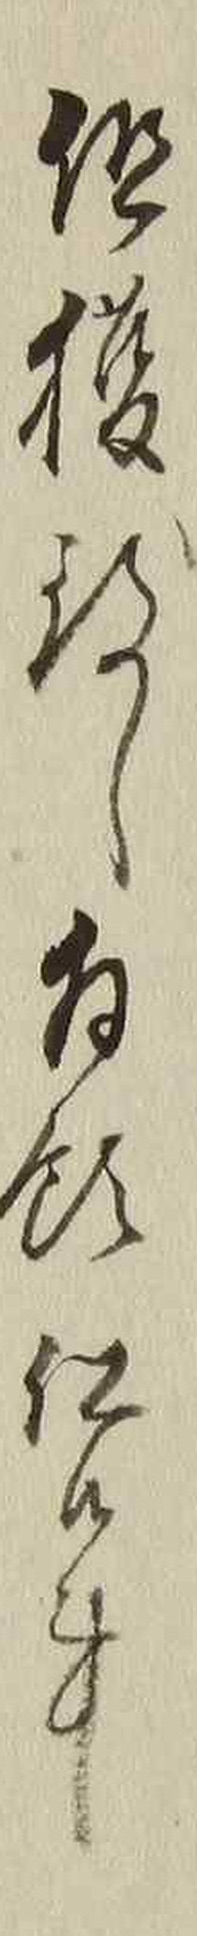但獲致し拝領仕候事
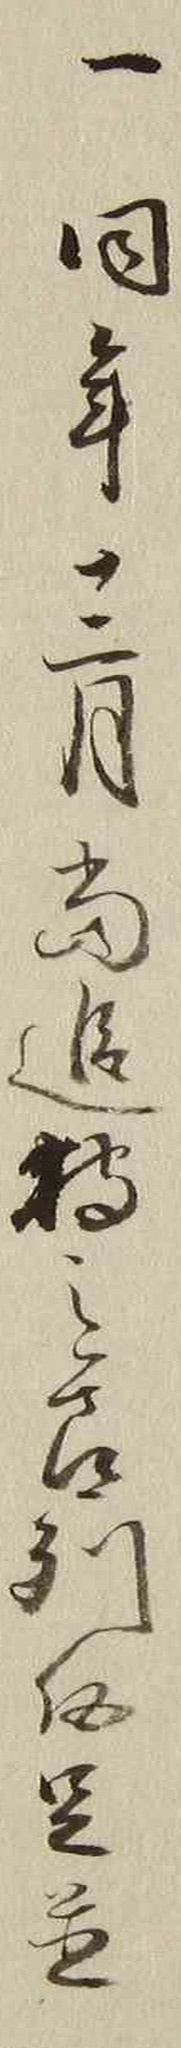一同年十二月当追狩之節列伍足並
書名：諸士系譜　巻之129　た之部5
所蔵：会津若松市立会津図書館
